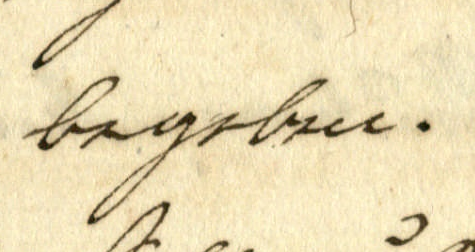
begeben.
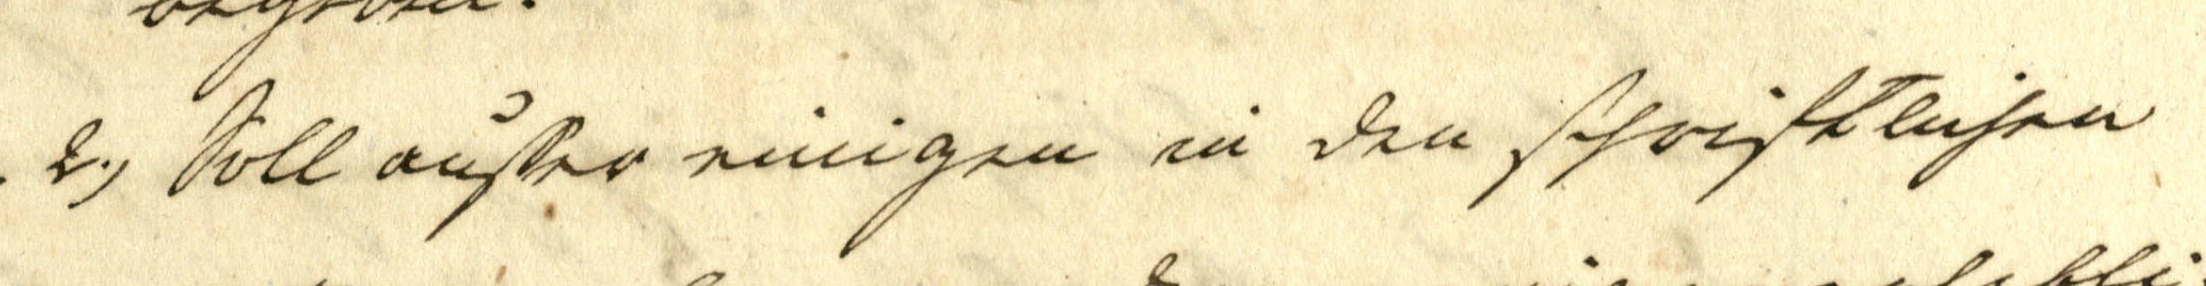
2., Soll ausser einigen in den schriftlichen
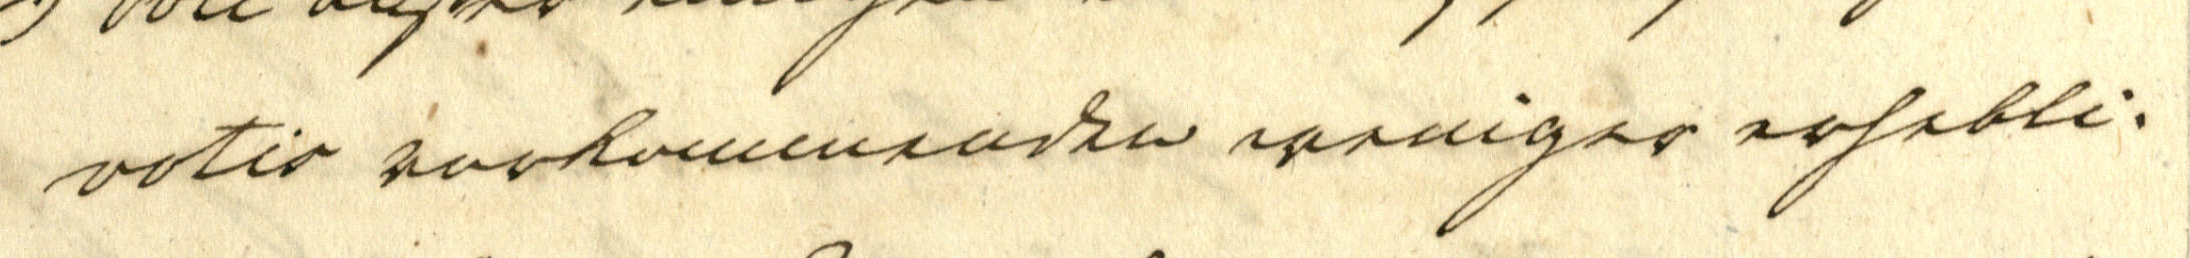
votis vorkommenden weniger erhebli¬
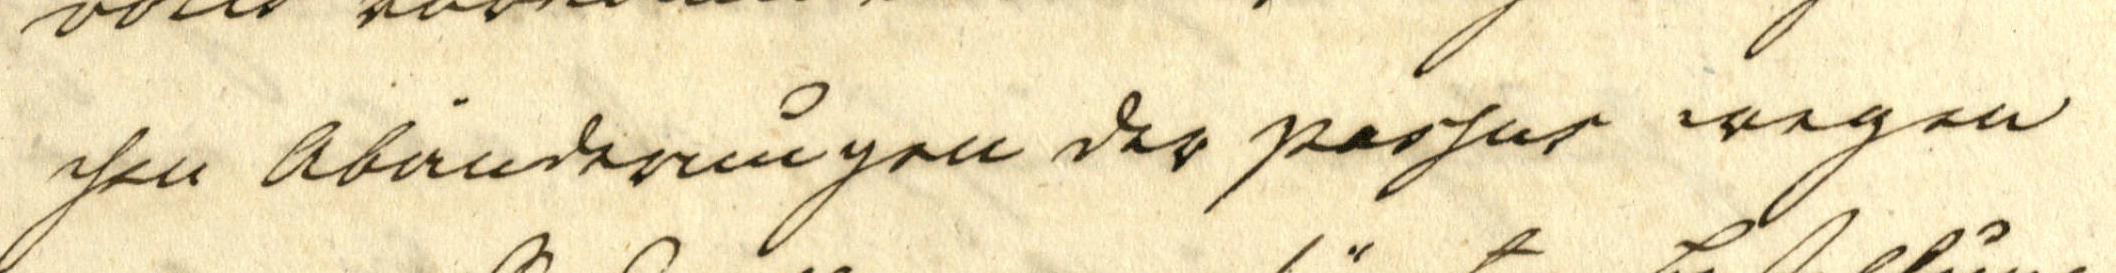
chen Abänderungen der passus wegen
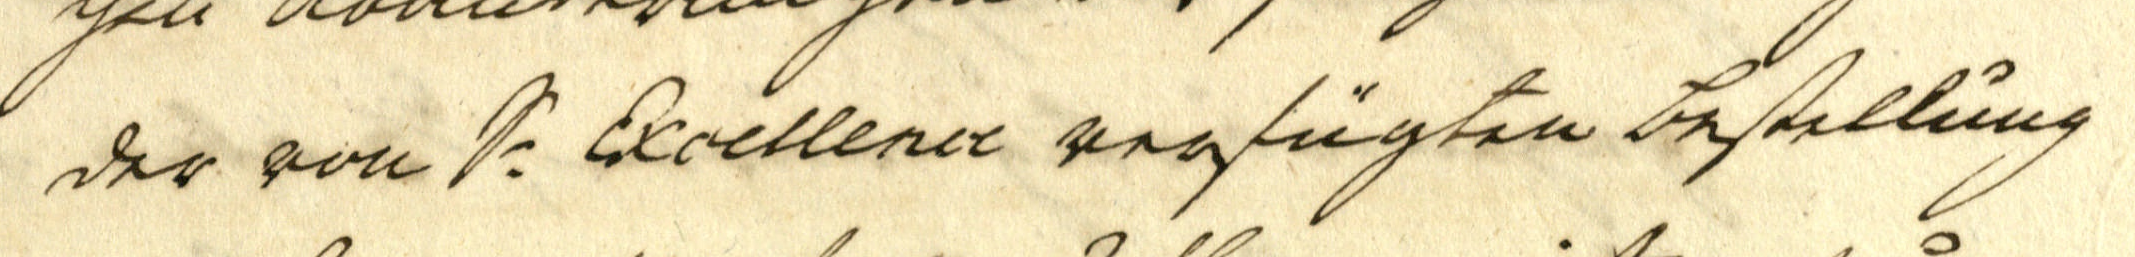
der von Sr. Excellence verfügten Bestellung
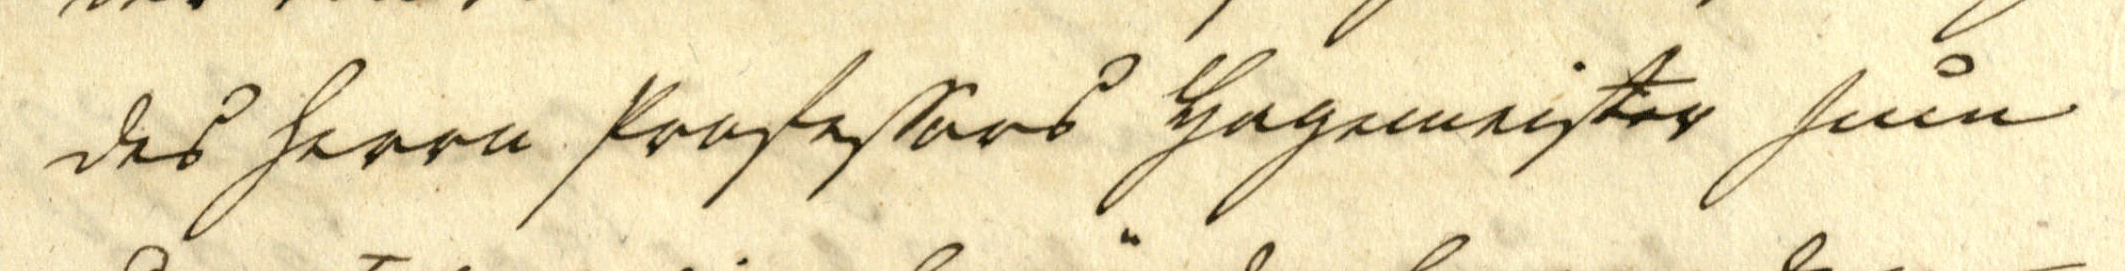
des Herrn Professors Hagemeister zum
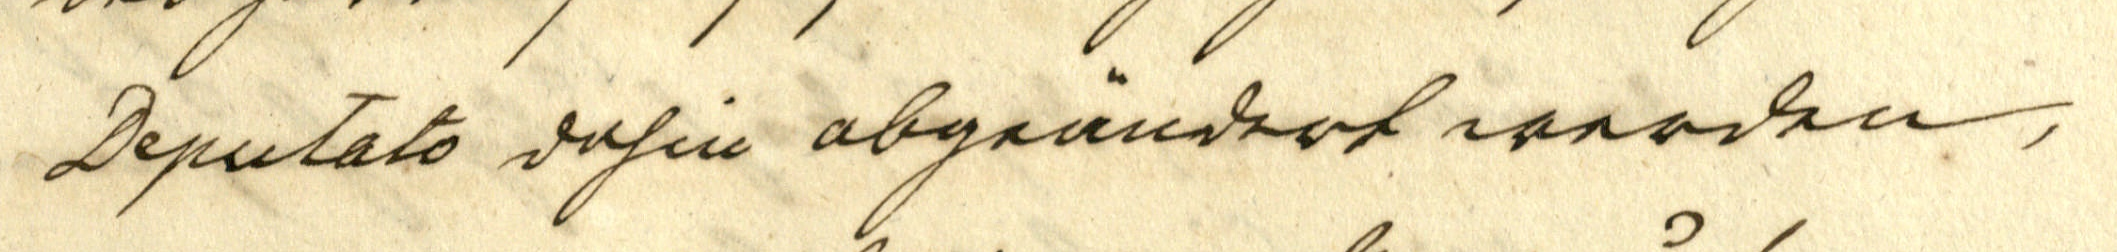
Deputato dahin abgeändert werden,
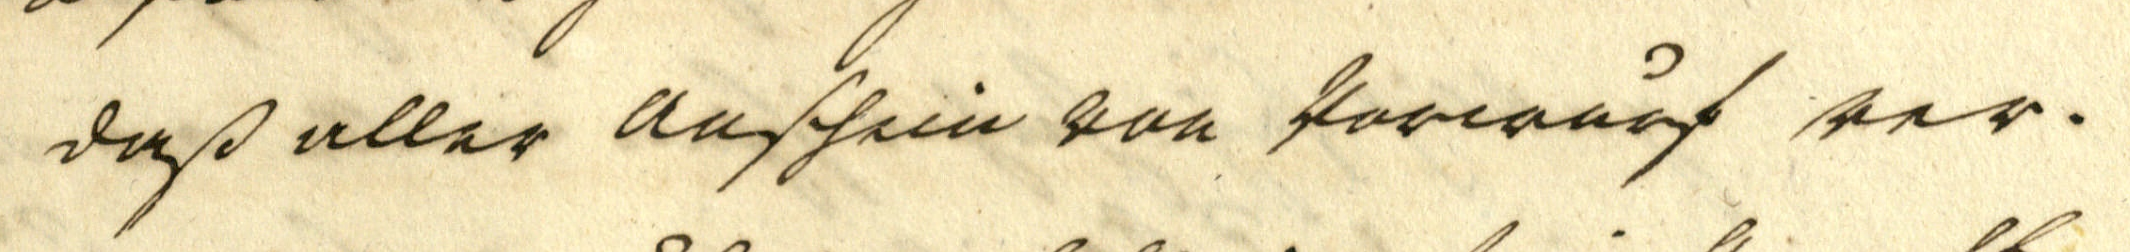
daß aller Anscheim von Vorwurf ver¬
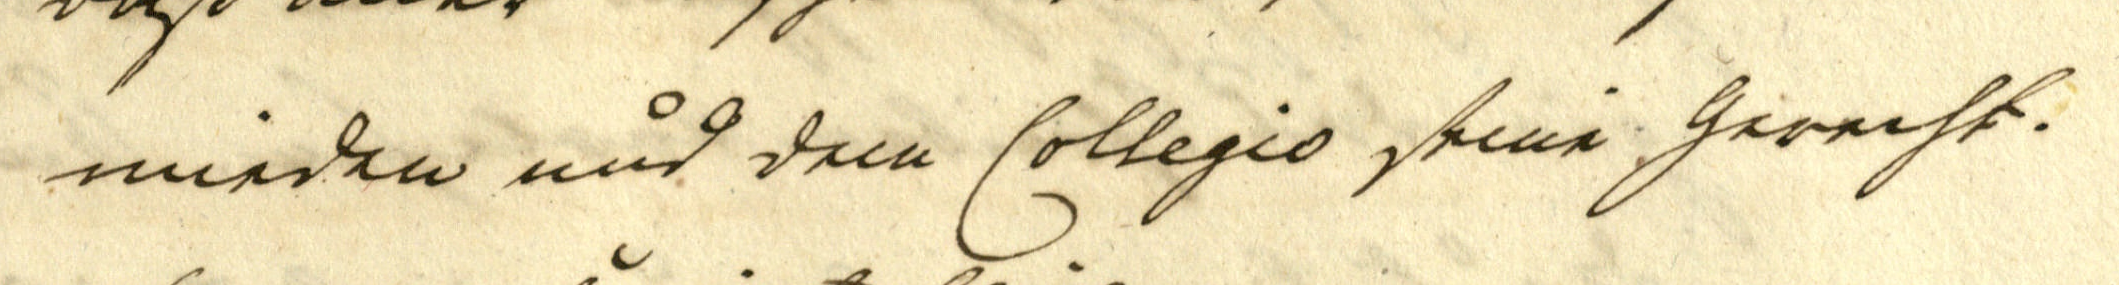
mieden und dem Collegio seine Gerecht-
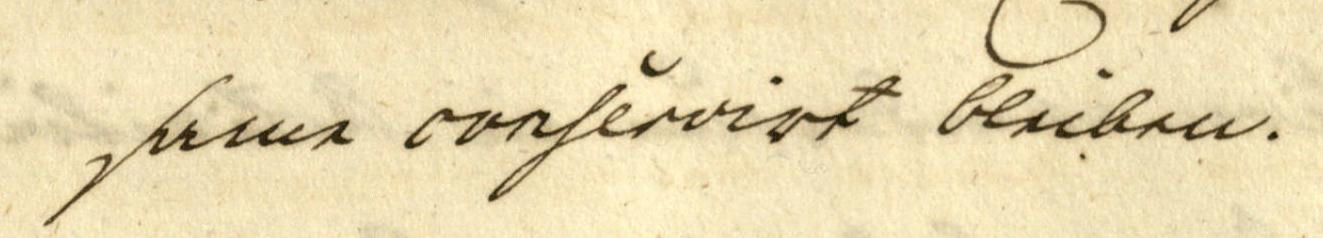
same conservirt bleiben.
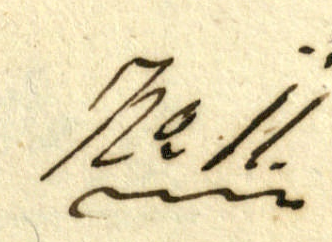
No. 11.
